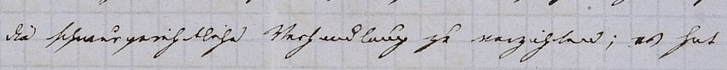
die schwurgerichtliche Verhandlung zu verzichten; es hat
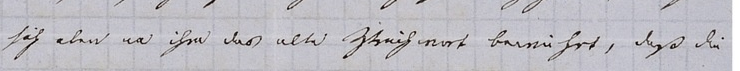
sich eben an ihm das alte Sprichwort bewährt, daß die
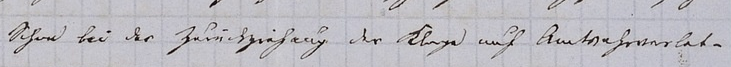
Schon bei der Zurückziehung der Klage auf Amtsehrverlet-
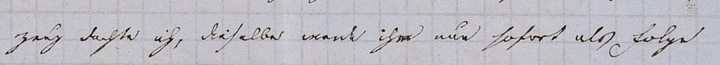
zung dachte ich, dieselbe werde ihm nun sofort als Folge
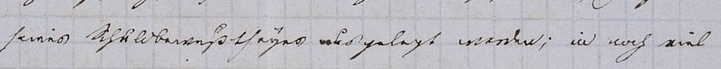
seines Schuldbewußtseyns ausgelegt werden; in noch viel
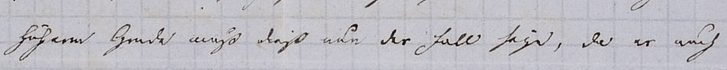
höherm Grade muß dieß nun der Fall seyn, da er auch
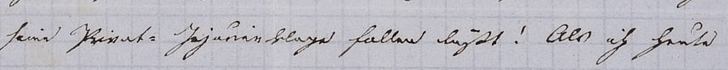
seine Privat-Injurienklage fallen läßt! Als ich heute
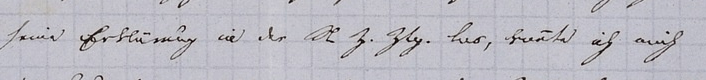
seine Erklärung in der N. Z. Ztg. las, konnte ich mich
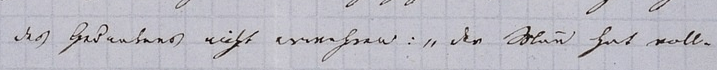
des Gedankens nicht erwehren: «Der Mann hat voll-
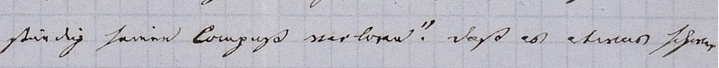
ständig seinen Compaß verloren»! Daß es etwas schwer
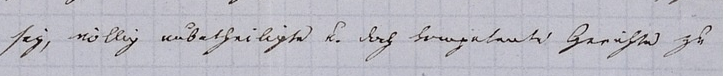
sey, völlig unbetheiligte u. doch kompetente Gerichte zu
